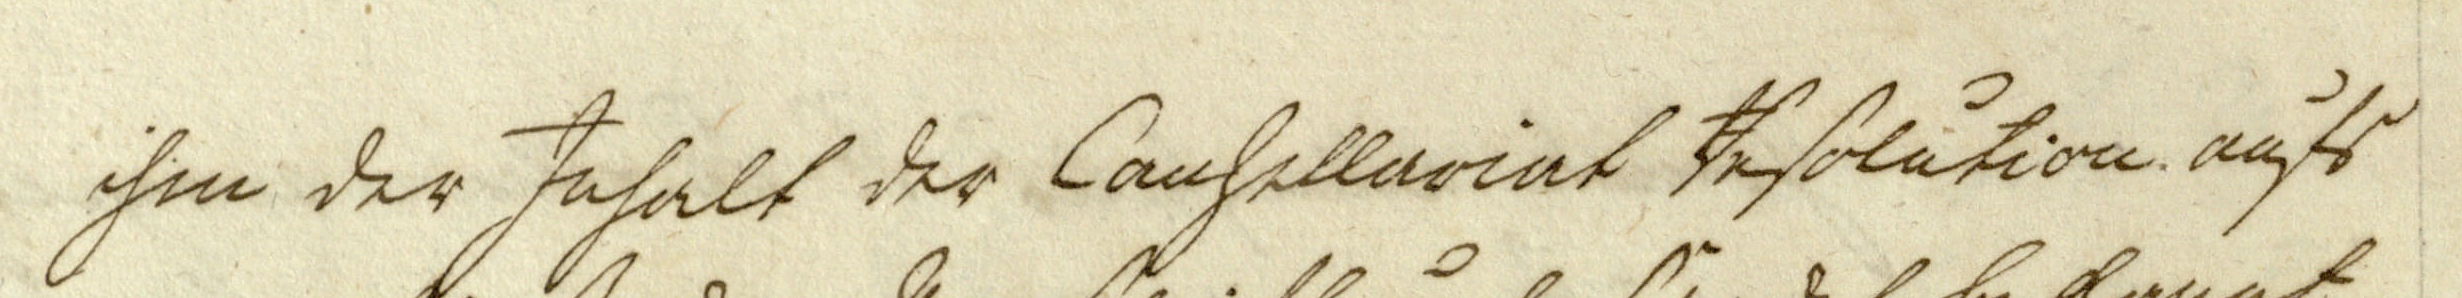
ihm der Inhalt der Canzellariat Resolution aufs
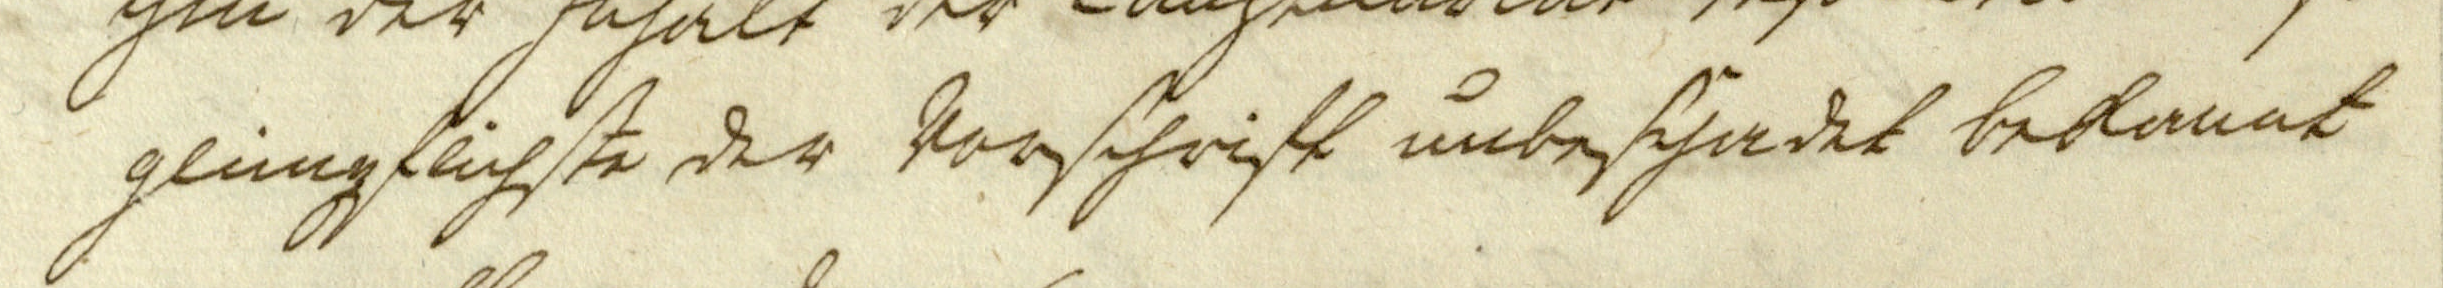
glimpflichste der Vorschrift unbeschadet bekannt
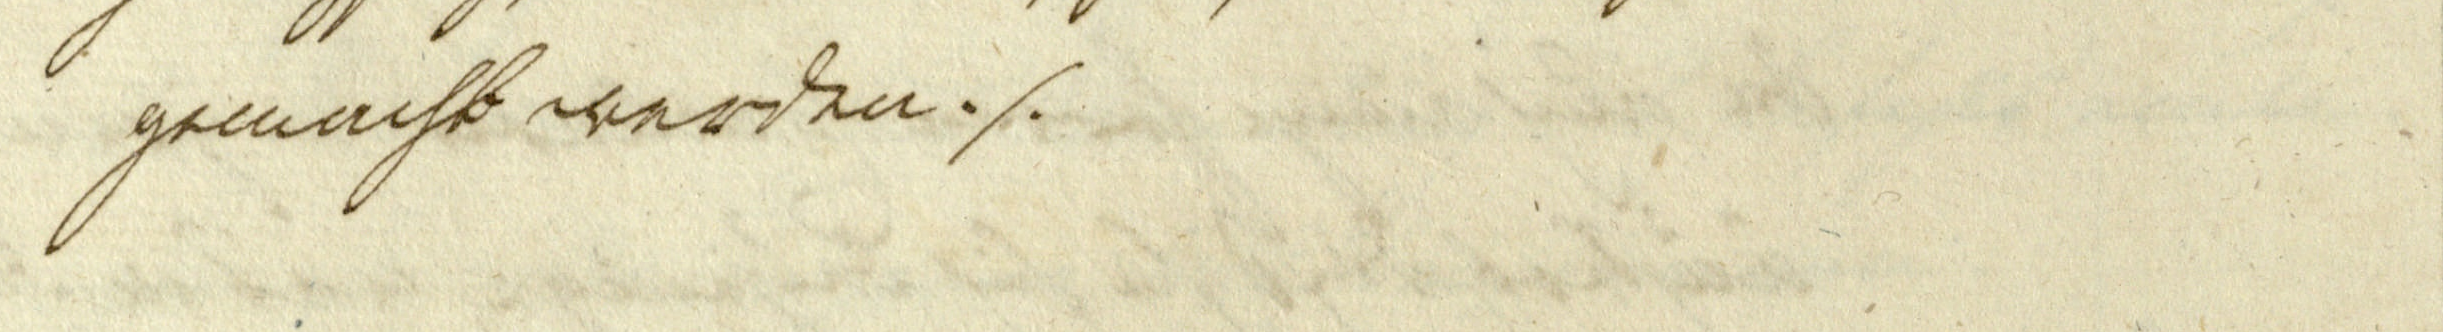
gemacht werden.
